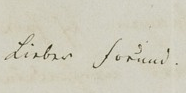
Lieber Freund.
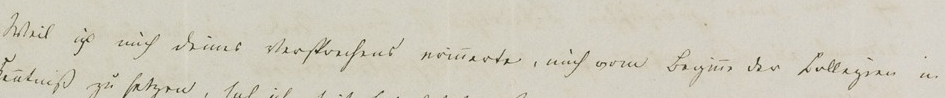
Weil ich mich deines Versprechens erinnerte, mich vom Beginne der Collegien in
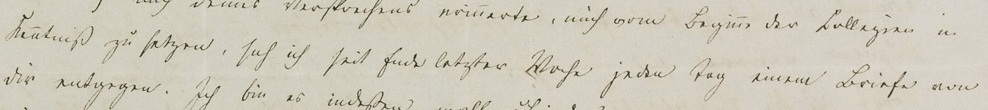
Kenntniß zu setzen, sah ich seit Ende letzter Woche jeden Tag einem Briefe von
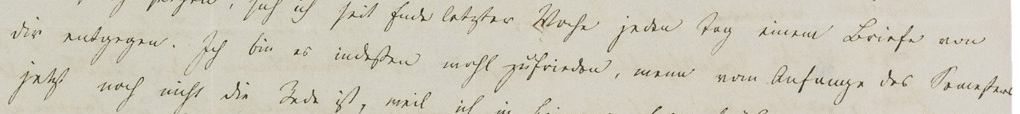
dir entgegen. Ich bin es indessen wohl zufrieden, wenn vom Anfange des Semesters
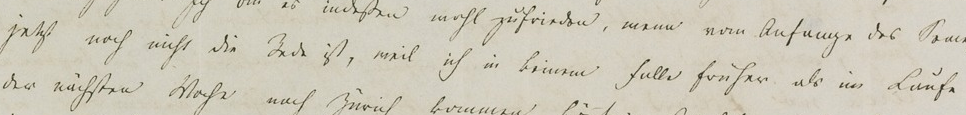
jetzt noch nicht die Rede ist, weil ich in keinem Falle früher als im Laufe
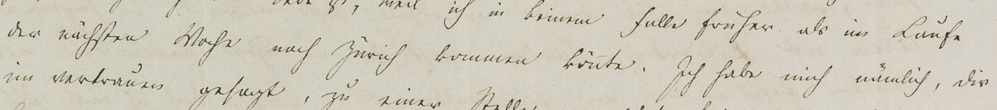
der nächsten Woche nach Zürich kommen könnte. Ich habe mich nämlich, dir
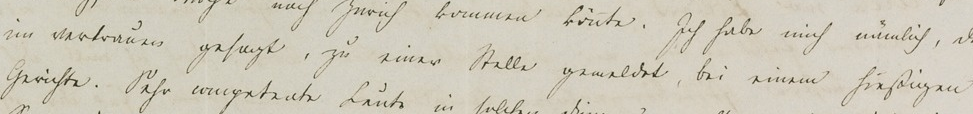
im Vertrauen gesagt, zu einer Stelle gemeldet, bei einem hießigen
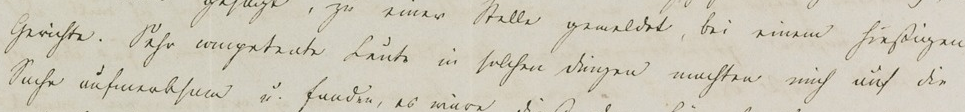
Gerichte. Sehr competente Leute in solchen Dingen machten mich auf die
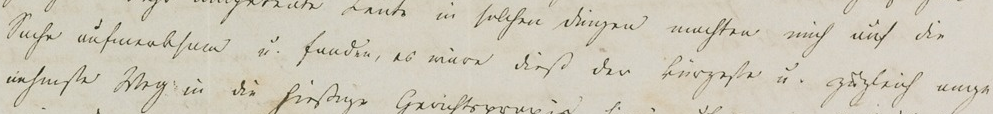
Sache aufmerksam u. fanden, es wäre dieß der kürzeste u. zugleich ange-
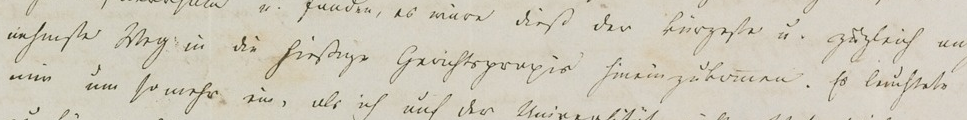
nehmste Weg in die hießige Gerichtspraxis hineinzukommen. Es leuchtete
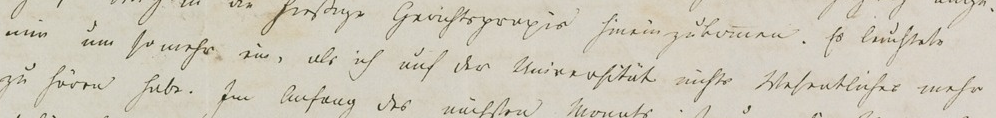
mir um so mehr ein, als ich auf der Universität nichts Wesentliches mehr
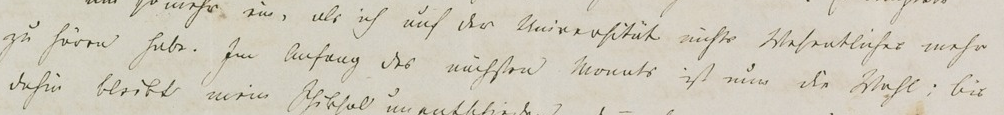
zu hören habe. Im Anfang des nächsten Monats ist nun die Wahl; bis
